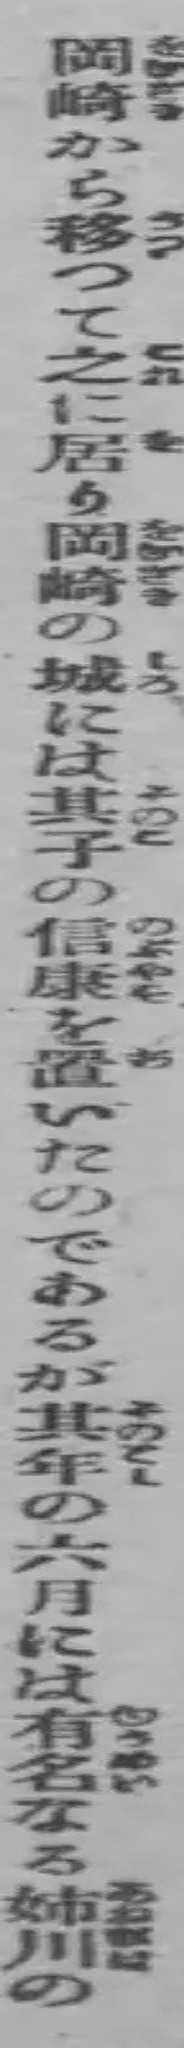姉川の合戦岡崎から移つて之に居り岡崎の城には其子の信康を置いたのであるが其年の六月には有名なる姉川の
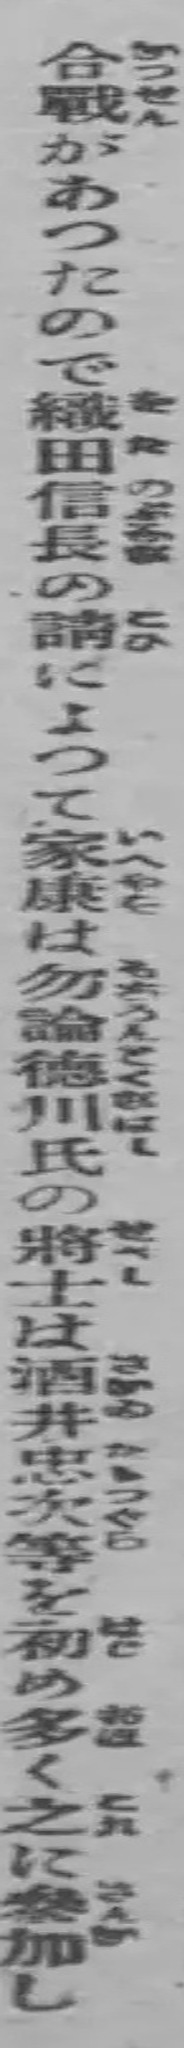合戦があつたので織田信長の請によつて家康は勿論徳川氏の将士は酒井忠次等を初め多く之に参加し
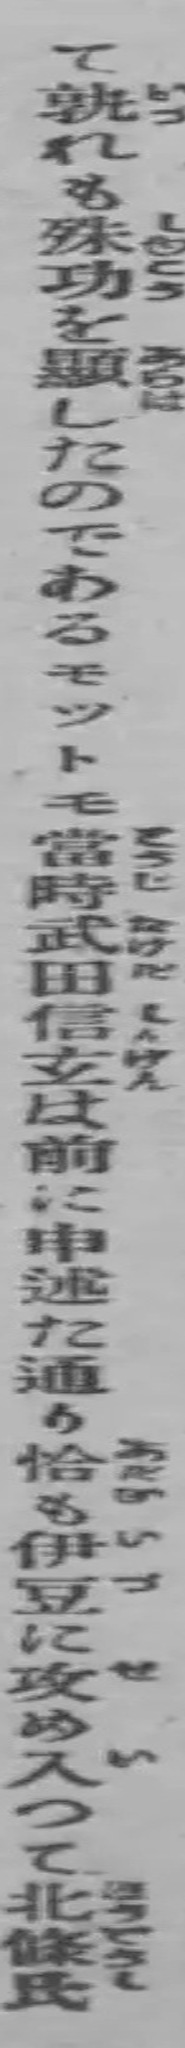て孰れも殊功を顕したのであるモツトモ当時武田信玄は前に申述べた通り恰も伊豆に攻め入つて北条氏
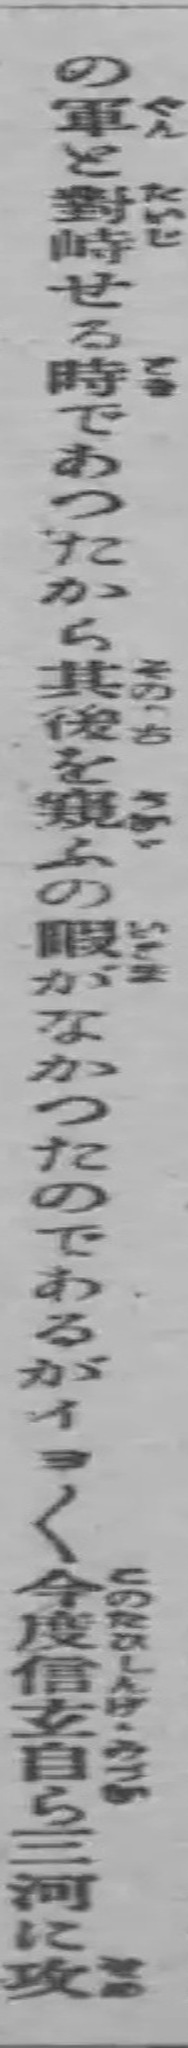の軍と対峙せる時であつたから其後を窺ふの暇がなかつたのであるがイヨ〳〵今度信玄自ら三河に攻
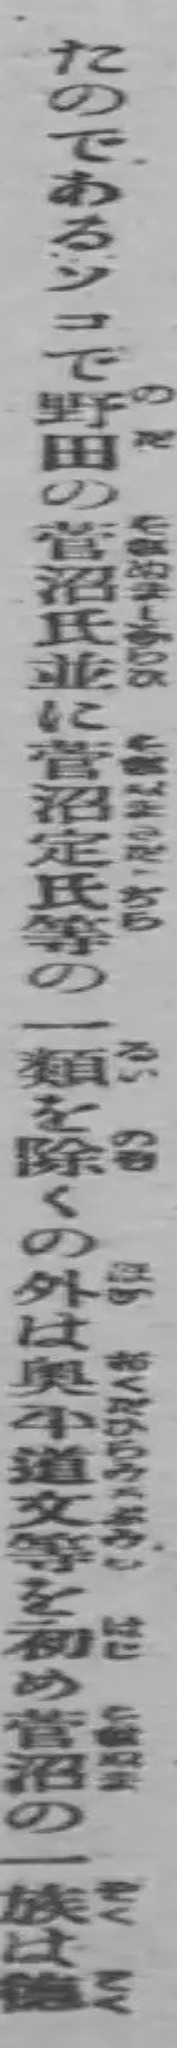たのであるソコで野田の菅沼氏並に菅沼定氏等の一類を除くの外は奥平道文等を初め菅沼の一族は徳
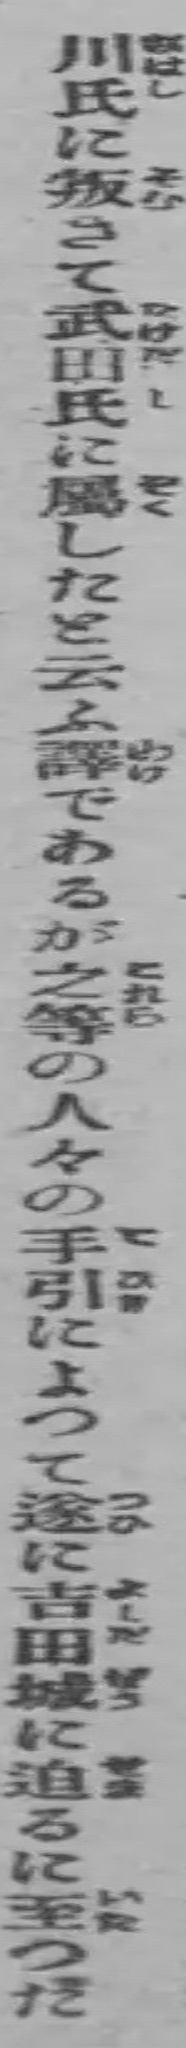川氏に叛きて武田氏に属したと云ふ訳であるがこ之等の人々の手引によつて遂に吉田城に迫るに至つた

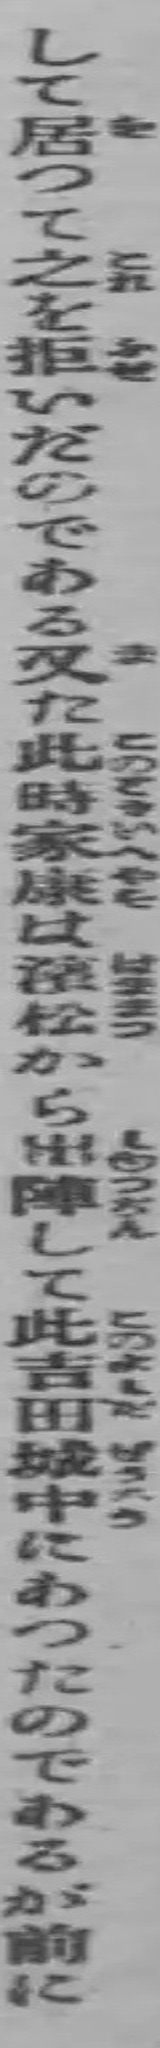して居つて之を拒いだのである又た此時家康は浜松から出陣して此吉田城中にあつたのであるが前に
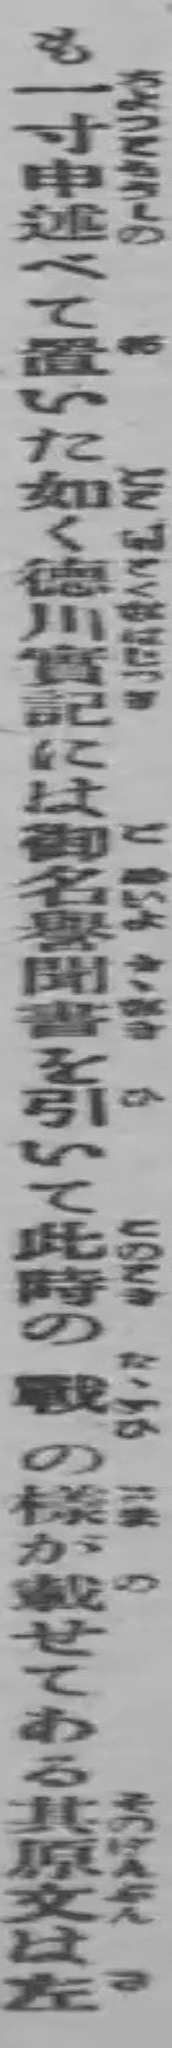二連木合戦も一寸申述べて置いた如く徳川実記には御名誉聞書を引いて此時の戦の様が載せてある後其原文は左
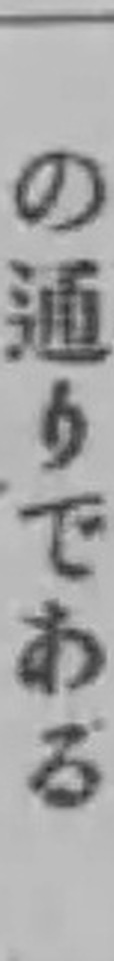の通りである
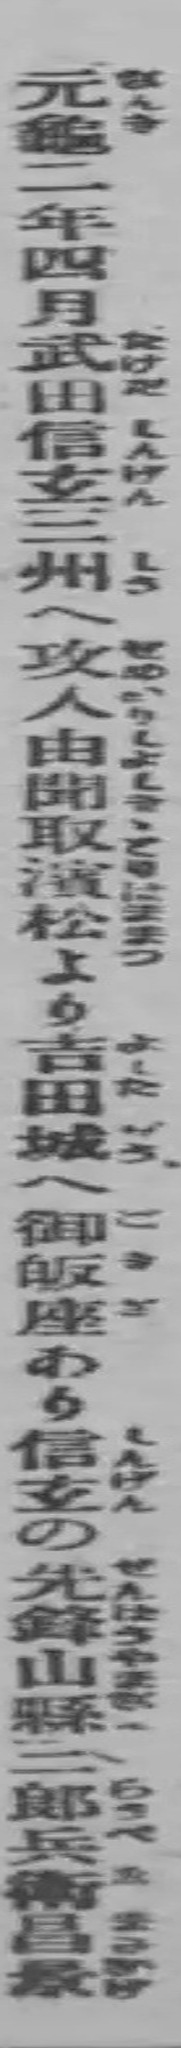元亀二年四月武田信玄三州へ攻入由聞取浜松より吉田城へ御皈座あり信玄の先鋒山縣三郎兵衛昌景
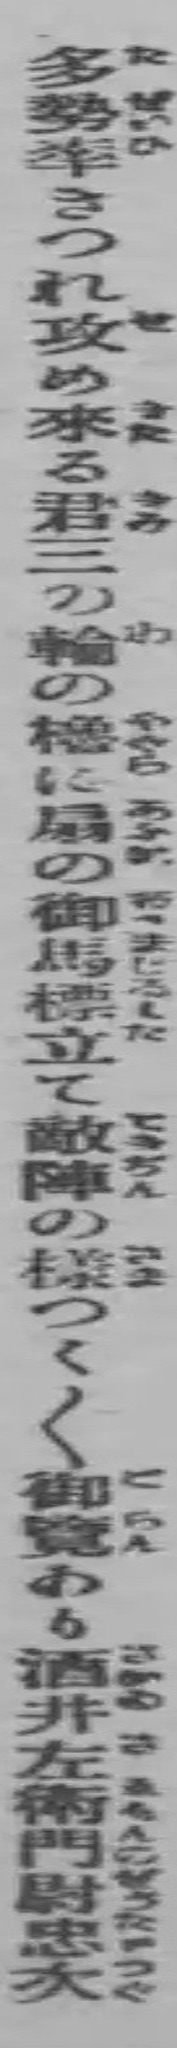多勢率きつれ攻め来る君三の輪の櫓に扇の御馬標立て敵陣の様つく〳〵御覧あり酒井左衛門尉忠次
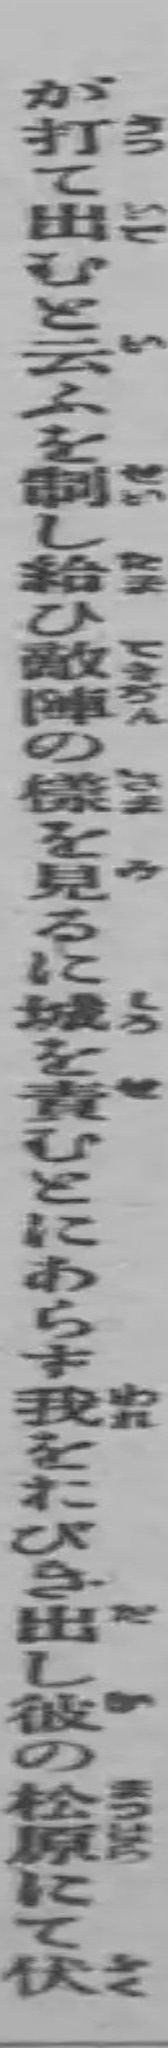が打て出むと云ふを制し給ひ敵陣の様を見るに城を責むとにあらず我をおびき出し彼の松原にて伏
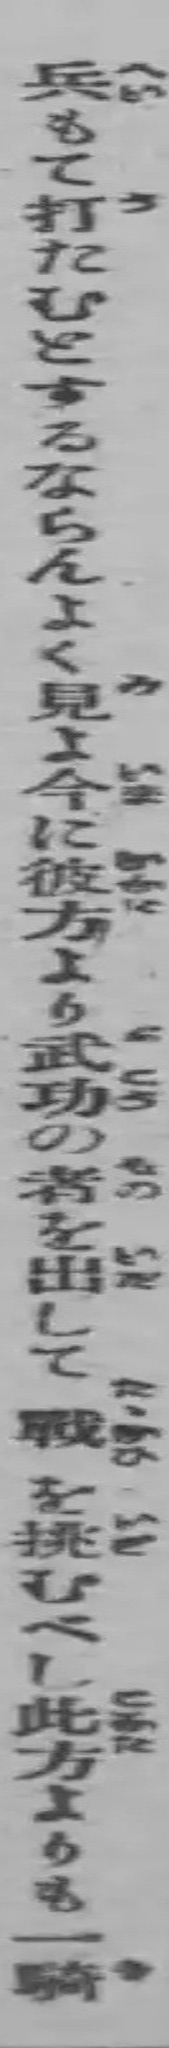兵もて打たむとするならんよく見よ今に彼方より武功の者を出して戦を挑むべし此方よりも一騎
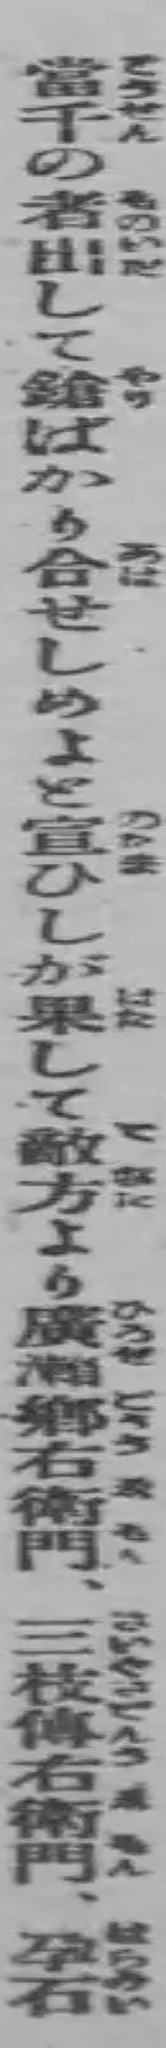当千の者出して鎗ばかり合せしめよと宣ひしが果して敵方より廣瀬郷右衛門、三枝伝右衛門、孕石
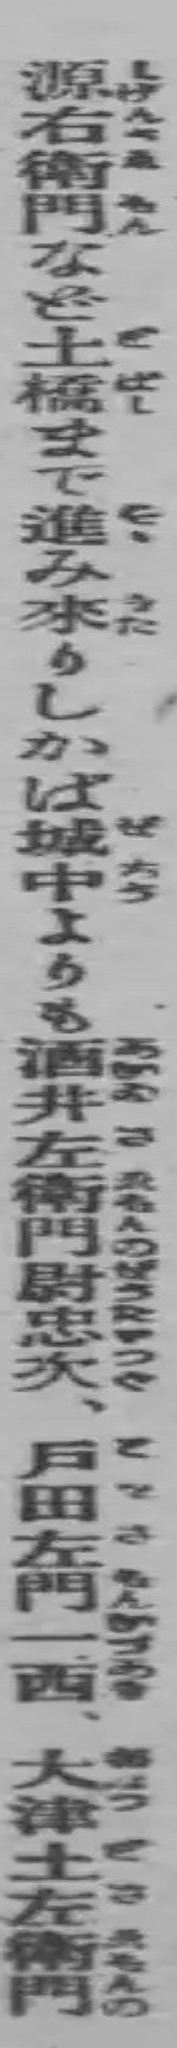源右衛門など土橋まで進み来りしかば城中よりも酒井左衛門尉忠次、戸田左門一西、大津土左衛門
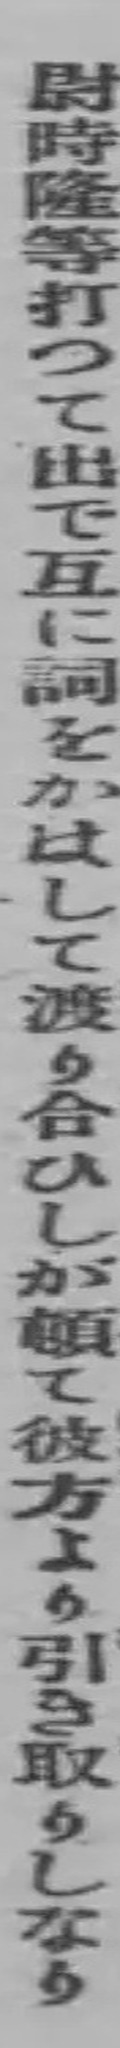尉時隆等打つて出で互に詞をかはして渡り合ひしが頓て彼方より引き取りしなり
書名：豊橋市史談
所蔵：国立国会図書館 National Diet Library, JAPAN
